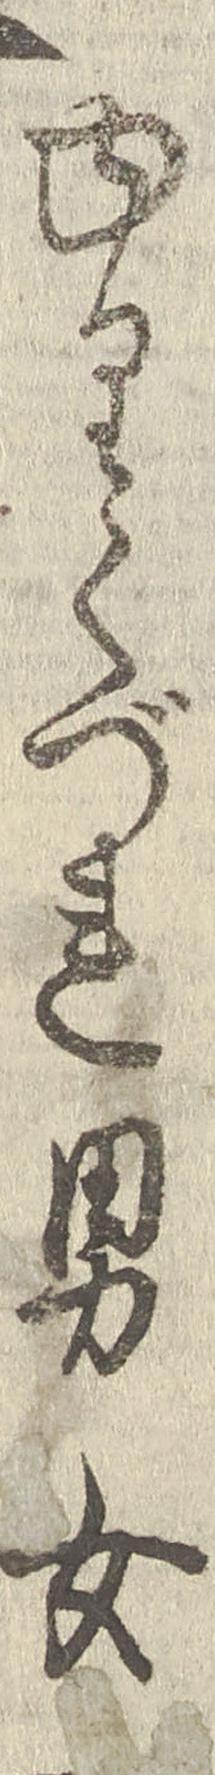ゆりくづれ男女
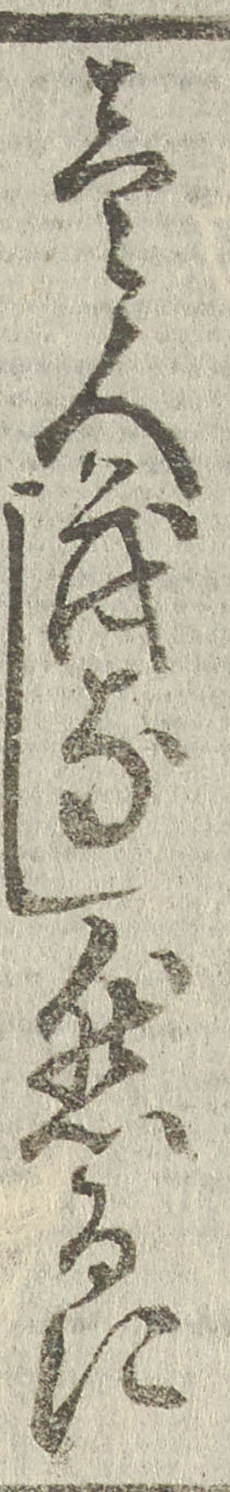壱人もなし然るに
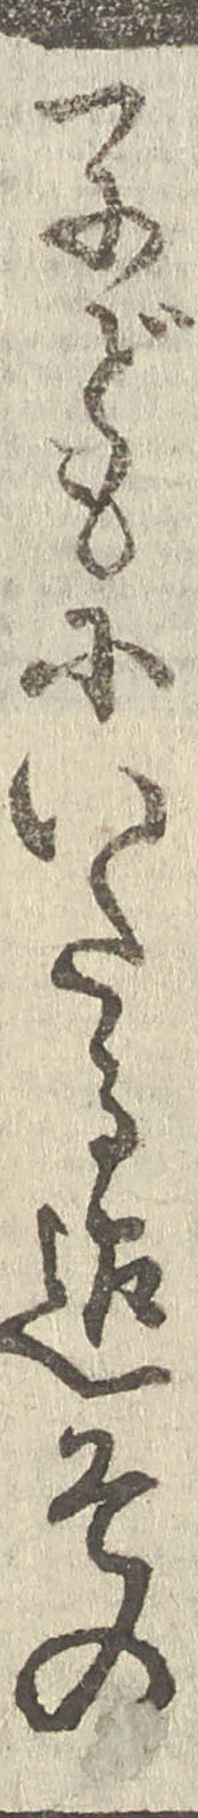子どもにいたる迄その
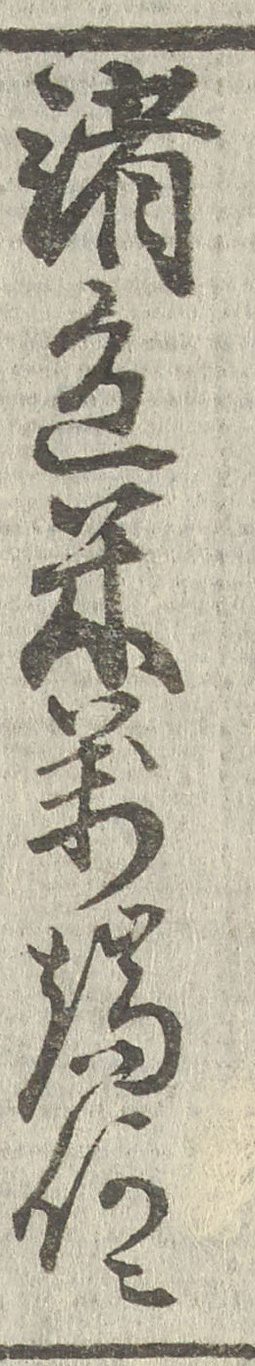諸色米万端何に
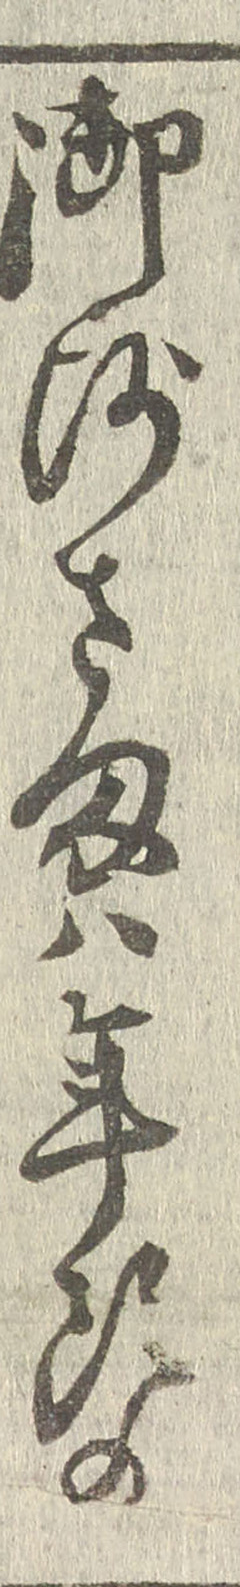御さまは年頭の
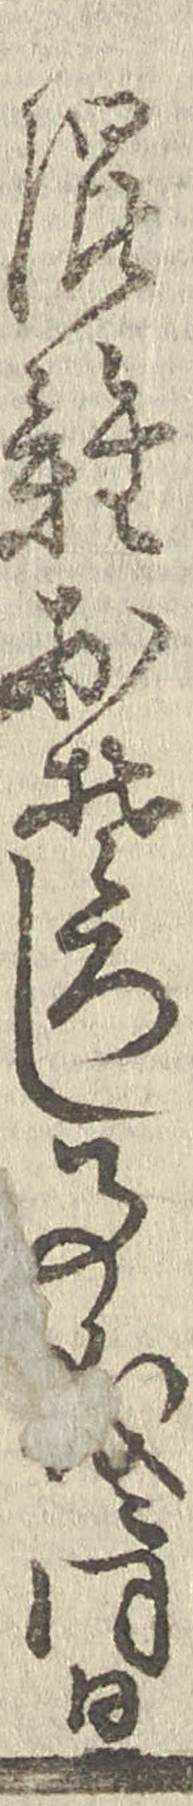混雑おそろし事成に同日
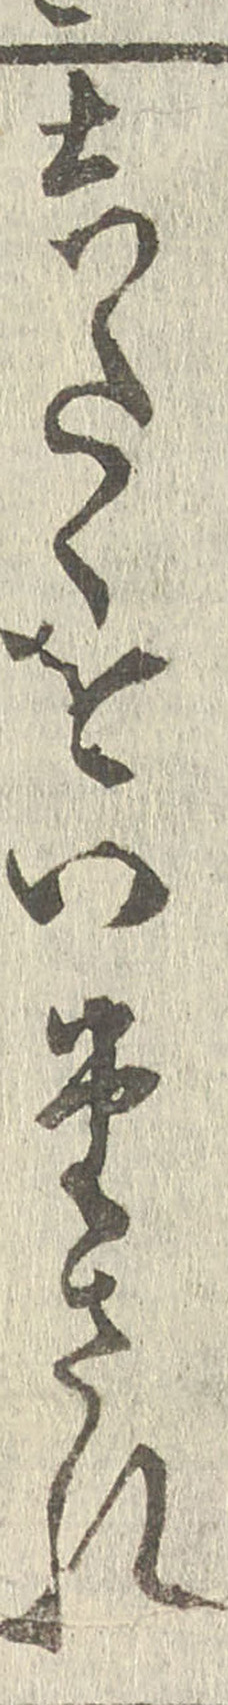したくをいたされ
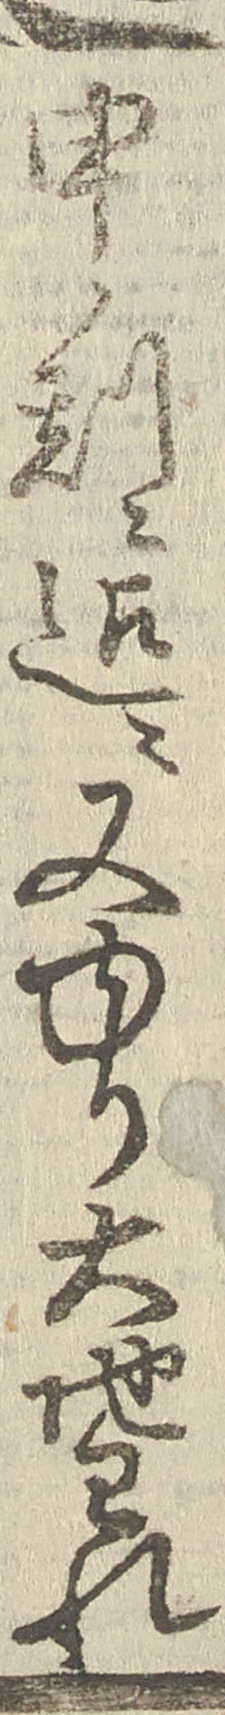申ノ刻に迄に又ゆり大地われ
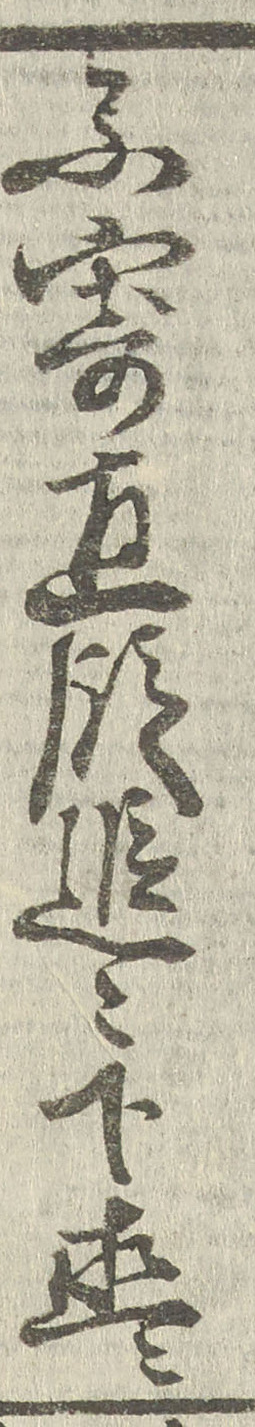不寄直段追々下直に
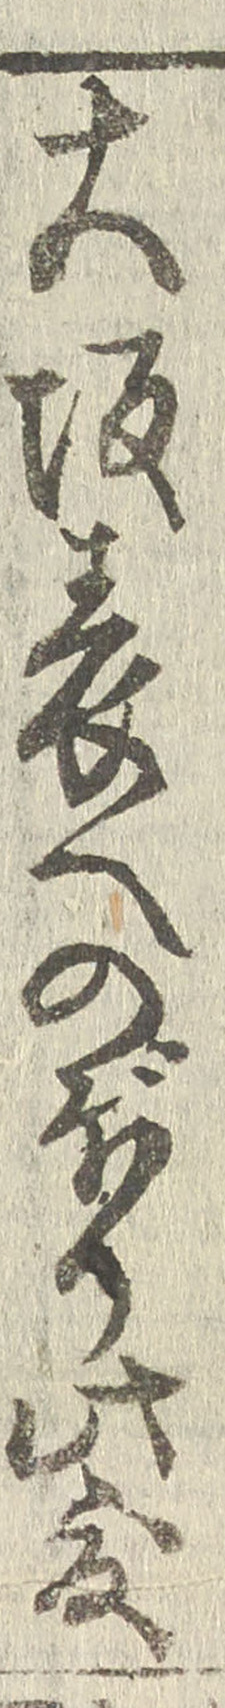大坂表へのぼり此度
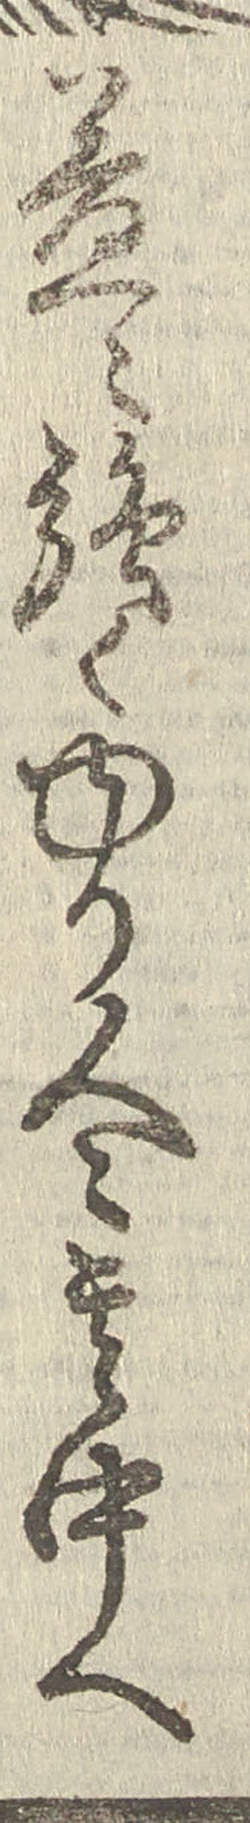益々強くゆり人々其中へ
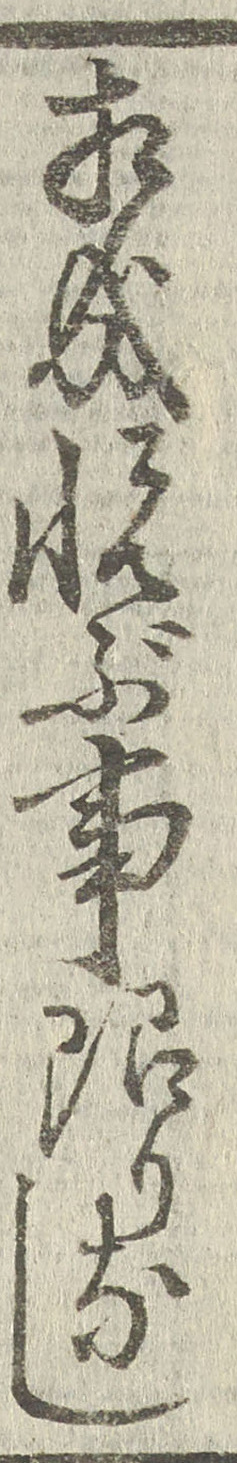相成悦ぶ事限りなし
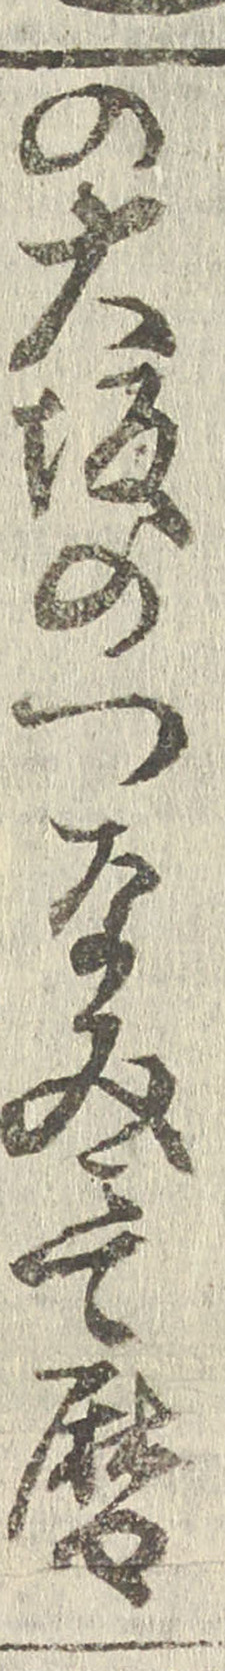の大坂のつなみにて暦
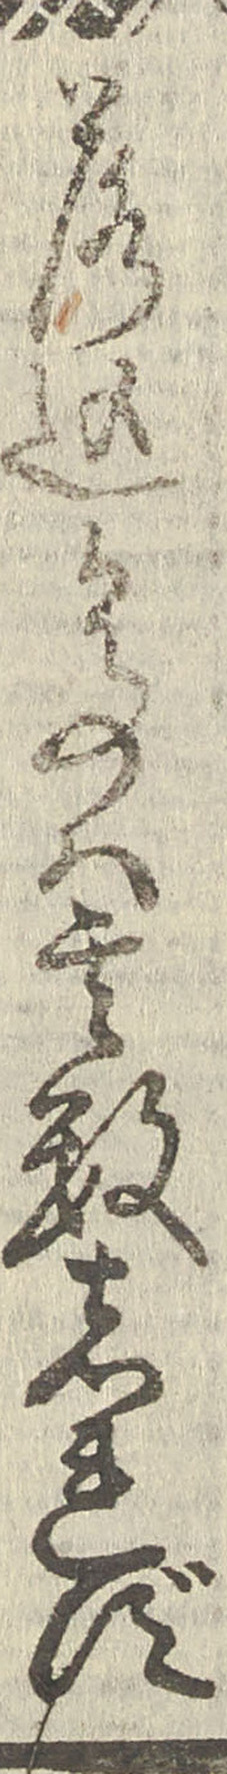落込候事は其数しれず
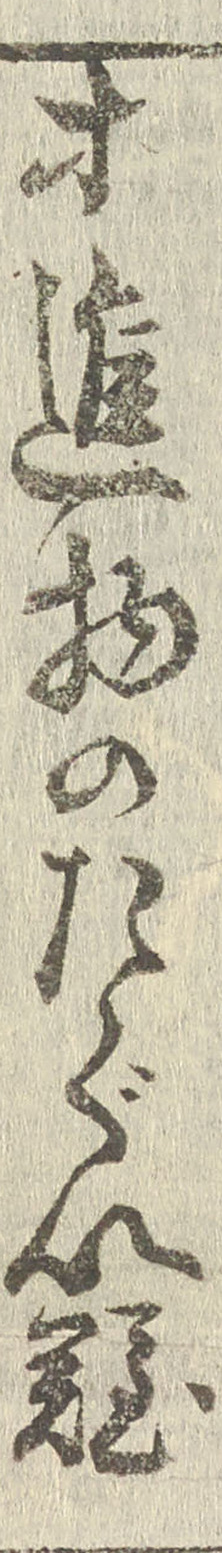など進物のたぐい難
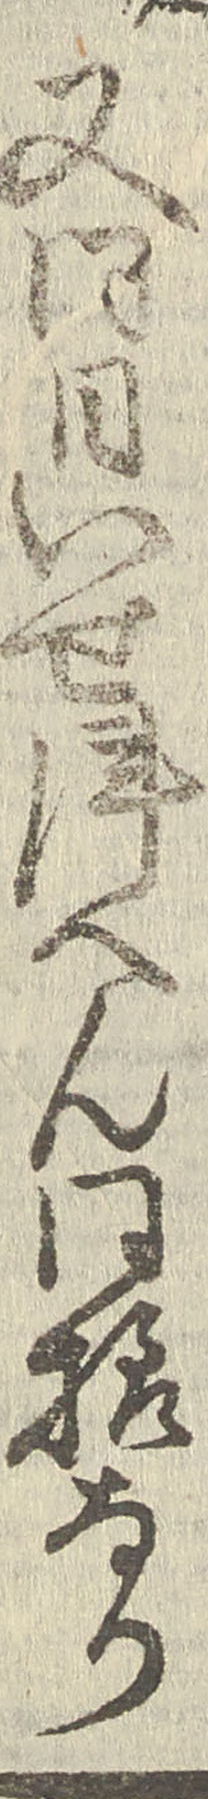又同日いせ津へん同様なり
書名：諸国大地震大津波 三編
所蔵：東京大学総合図書館 General Library in the University of Tokyo, JAPAN
